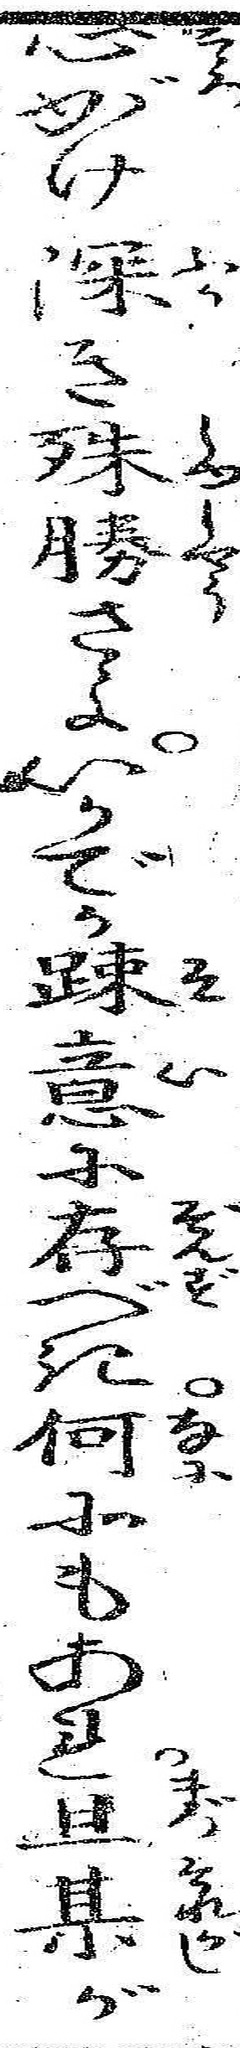心がけ深き殊勝さよ。いかでか疎意に存べき。何にもあれ。且某が
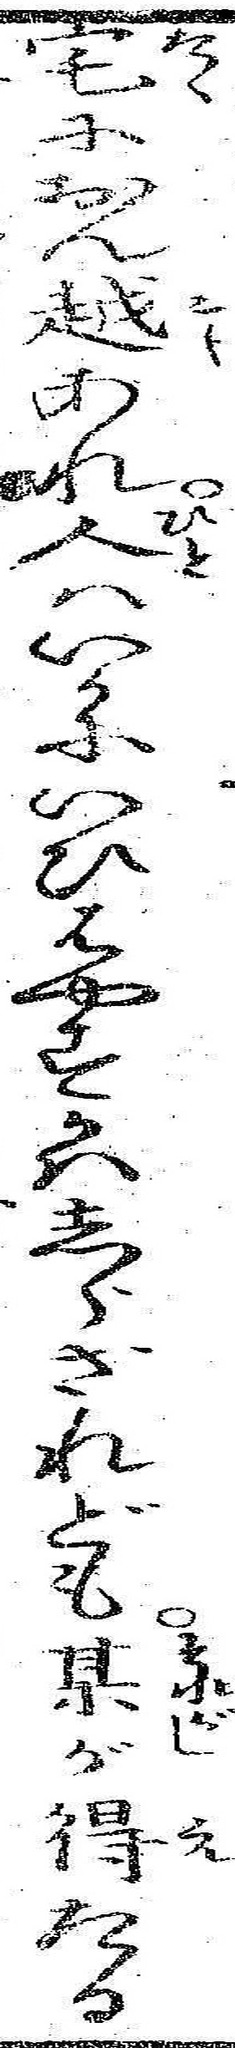宅におん越あれ。人はいかにいひはやすかはしらざれども。某が得たる
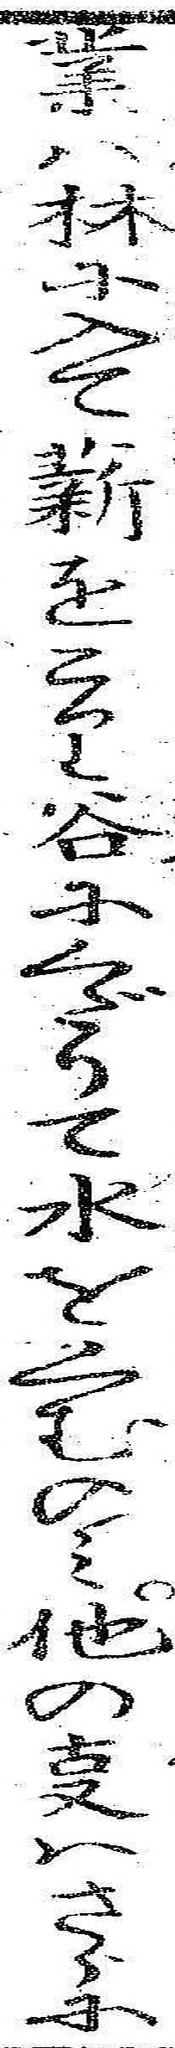業は。林に入て薪をとり谷にくだりて水をくむのみ。他の事はさらに
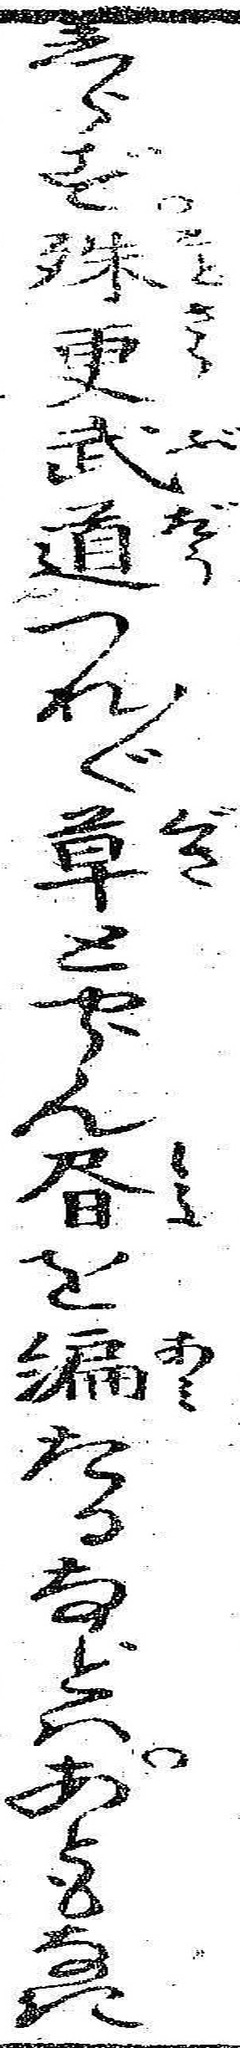しらず。殊更武道つれ〴〵草とやらん書を編たるなどは。あともなき
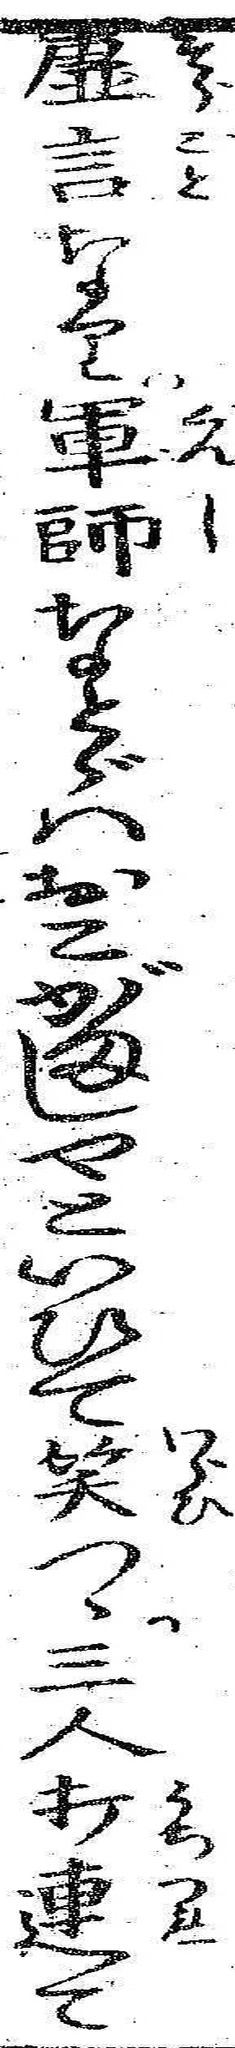虚言なり。軍師なとゞはおこがましやといひて笑つゝ。三人打連て
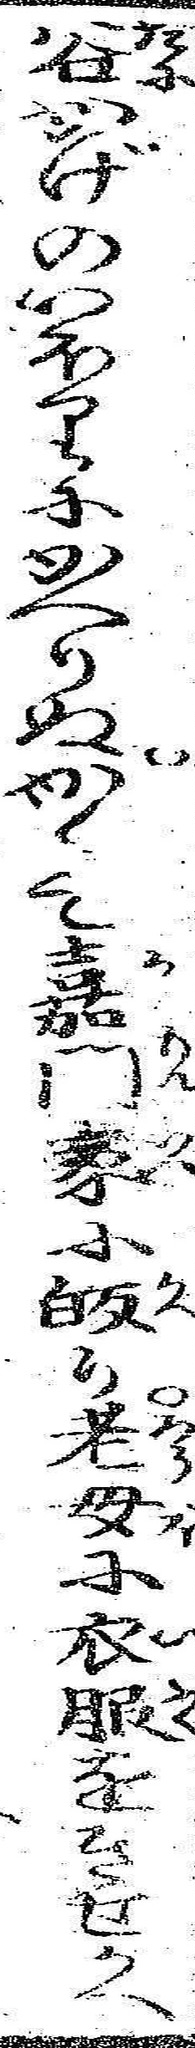谷かげのいほりにかへりぬ。かくて嘉門家に帰り。老母に衣服をきせかへ
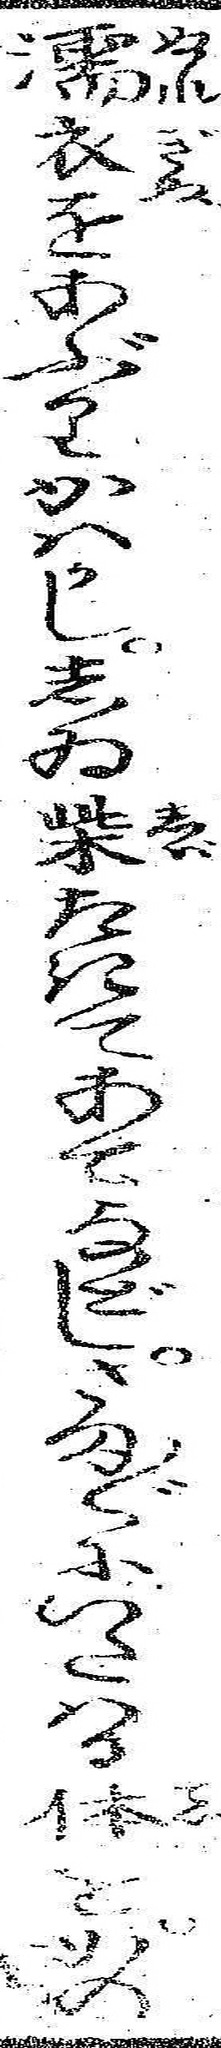濡衣をあぶりかはかし。しゐ柴たきてあてなどし。さま〴〵にいたはる体を。かの
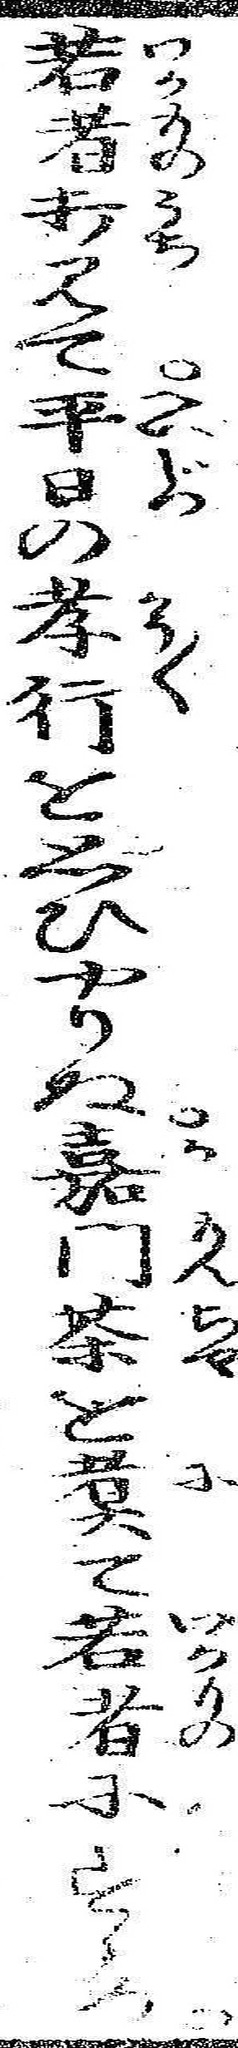若者打見て。平日の孝行を思ひやりぬ。嘉門茶を煮て若者にすゝめ。
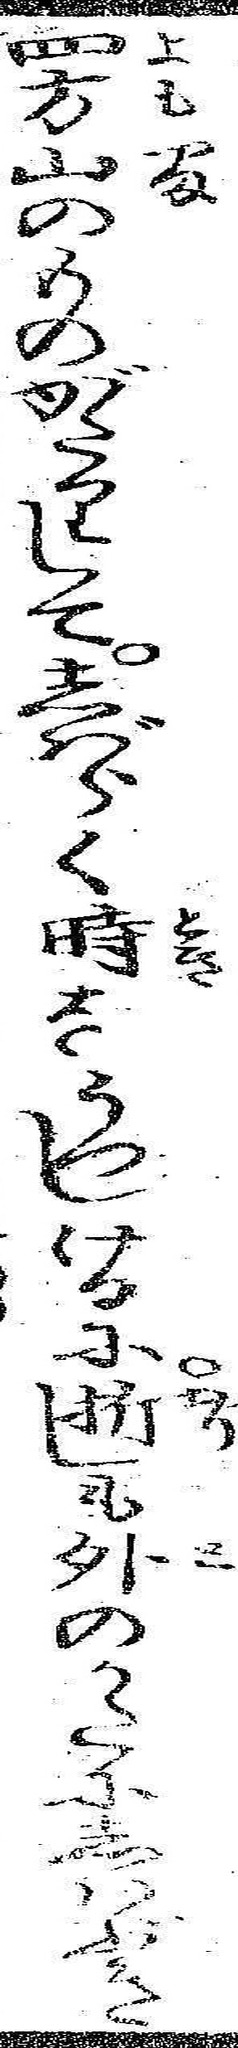四方山のものがたりして。しばらく時をうしつけるに。折しも外のかたにしはぶき
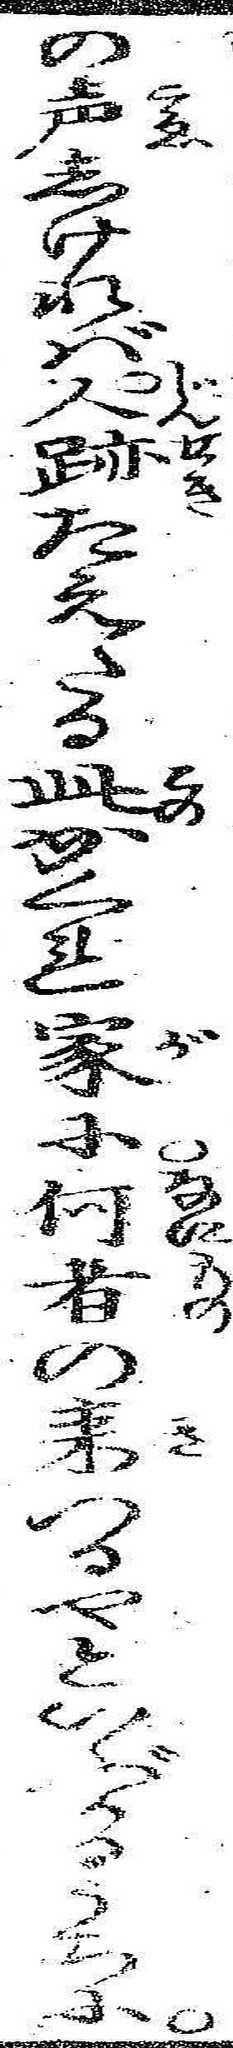の声しければ。人跡たえたる此かくれ家に。何者の来つるやといぶかるうちに。
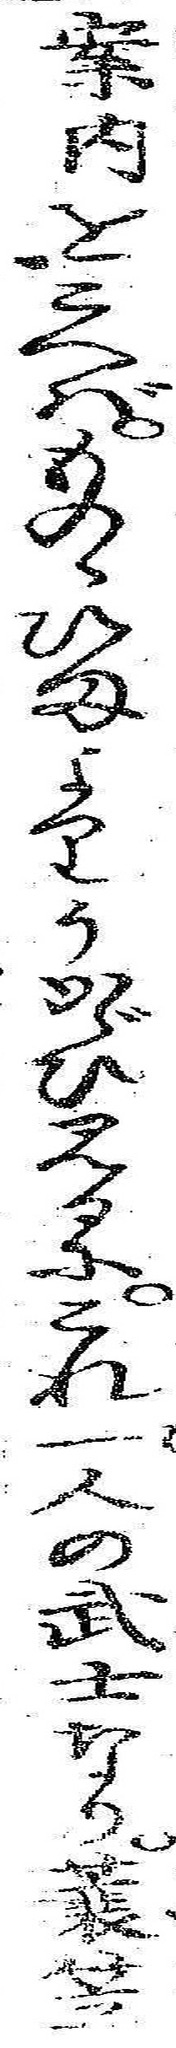案内をこへば。ものゝひまよりうかゞひ見るに。これ一人の武士なり。簑笠
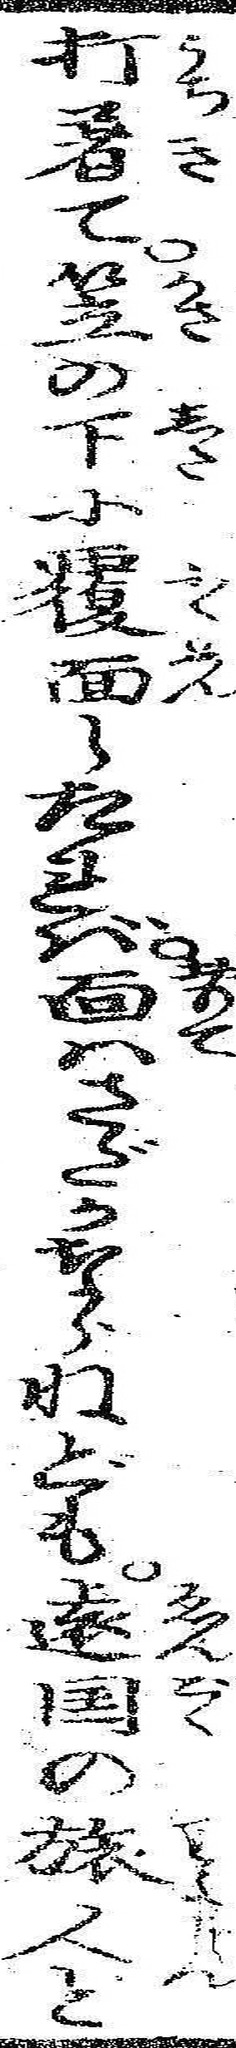打着て。笠の下に覆面したれば。面はさだかならねども。遠国の旅人と
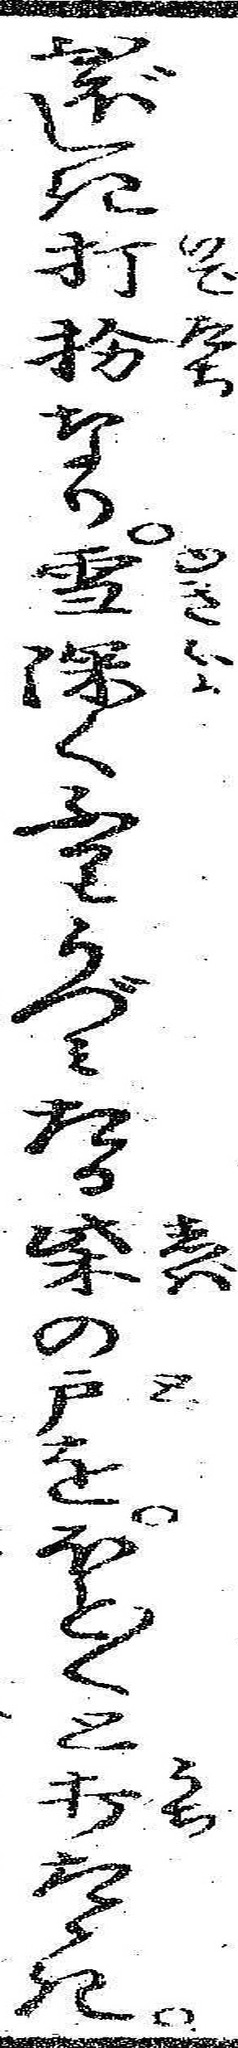おぼしき打扮なり。雪深くふりうづみたる柴の戸を。ほと〳〵と打たゝき。
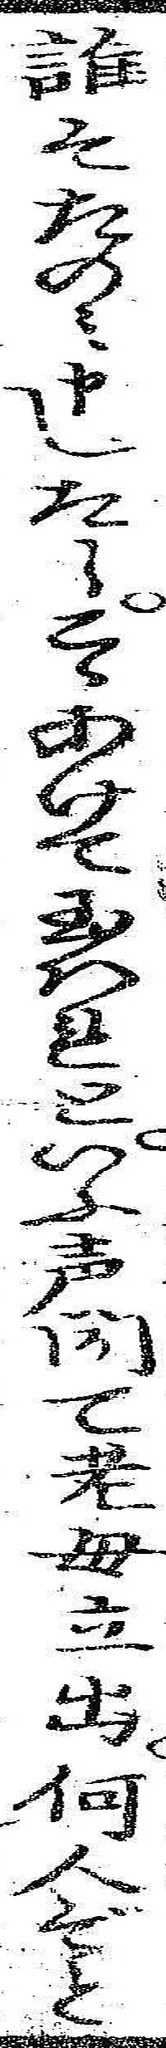誰そたのみ申したし。こゝあけて玉はれと。いふ声聞て老母立出。何人ぞと
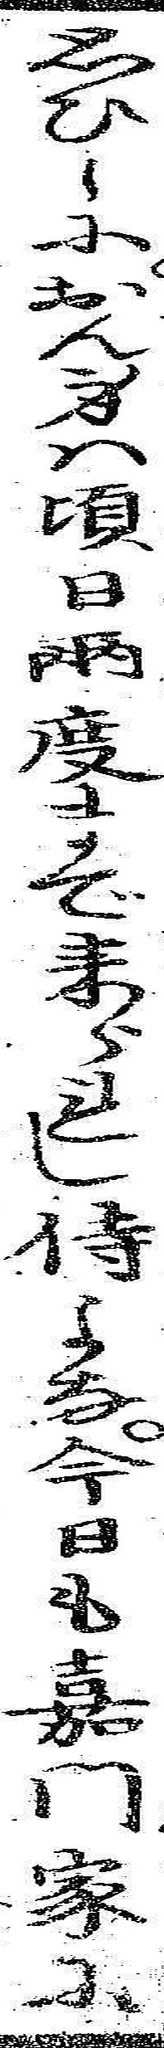思ひしに。おん身は頃日両度まで来られし侍よな。今日も嘉門家に
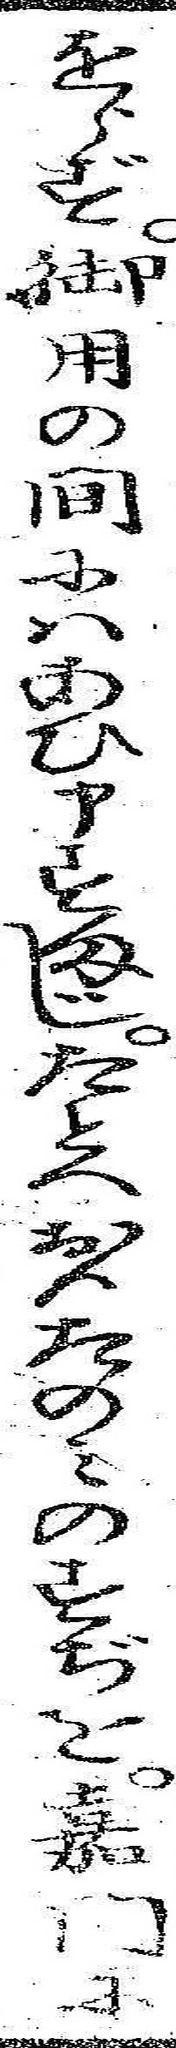をらず。御用の間にはあひ申すまじ。たとへおんたのみのすぢを。嘉門に
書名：昔話稲妻表紙
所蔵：国文学研究資料館
